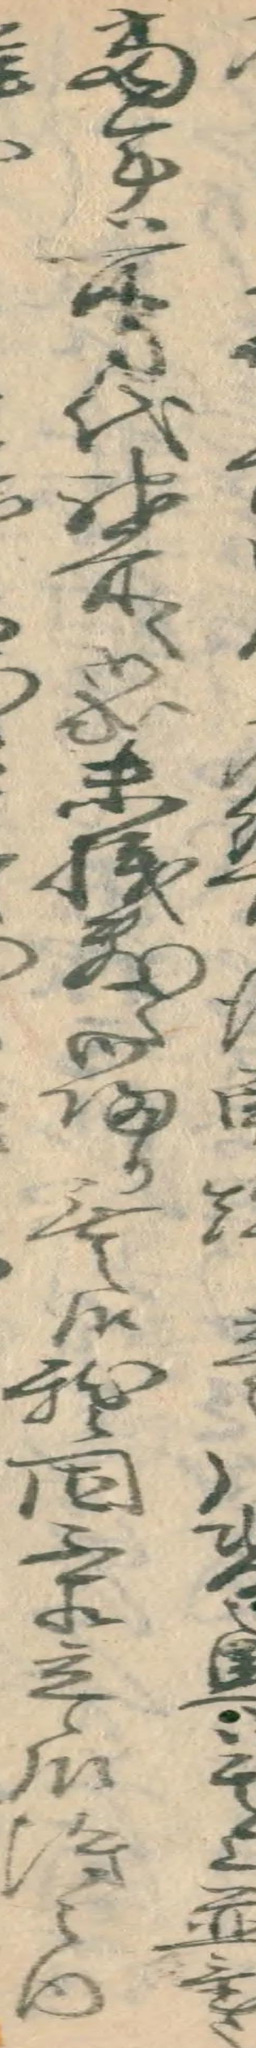当年ハ所司代神前へ御出未桟敷へ御帰り無之故諬固不相立候故埒之内
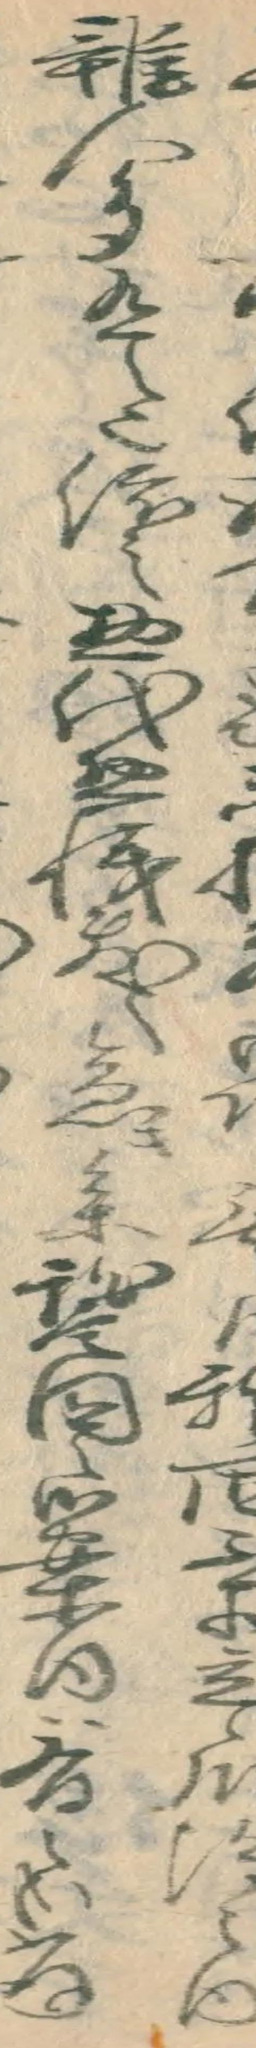雑人多有之也依之惣代惣桟敷へ急キ参諬固之御案内ハ有之哉如何
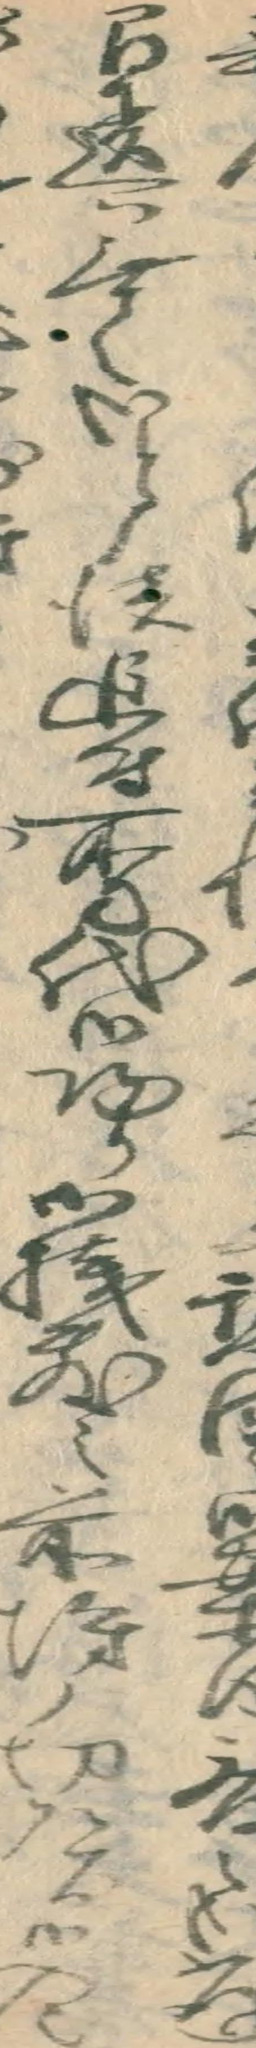間違ハ無之哉と申談追付所司代御帰り御桟敷之前埒之切道ゟ御入也
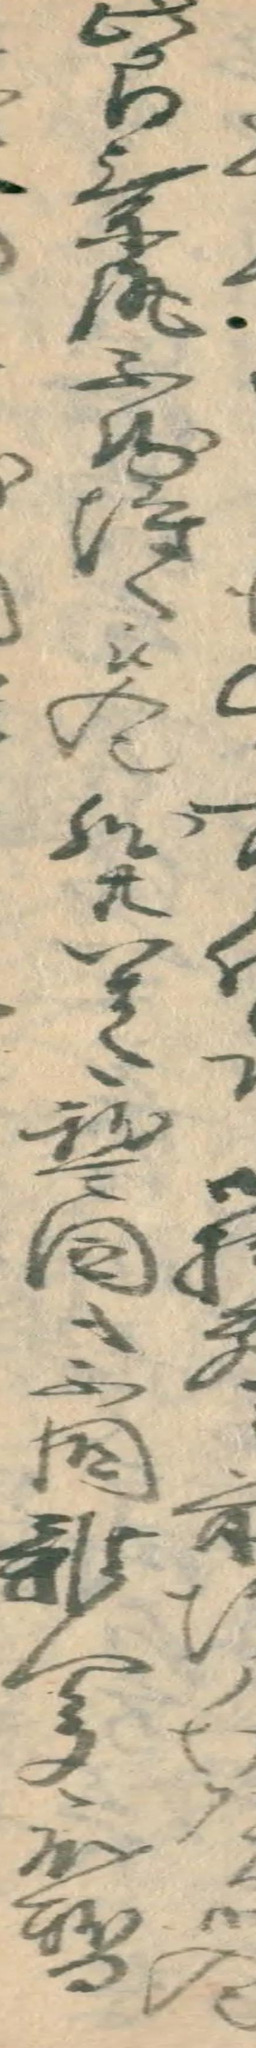此間乗尻不残埒へ被入也然共いまた諬固も不固雑人多候故暫
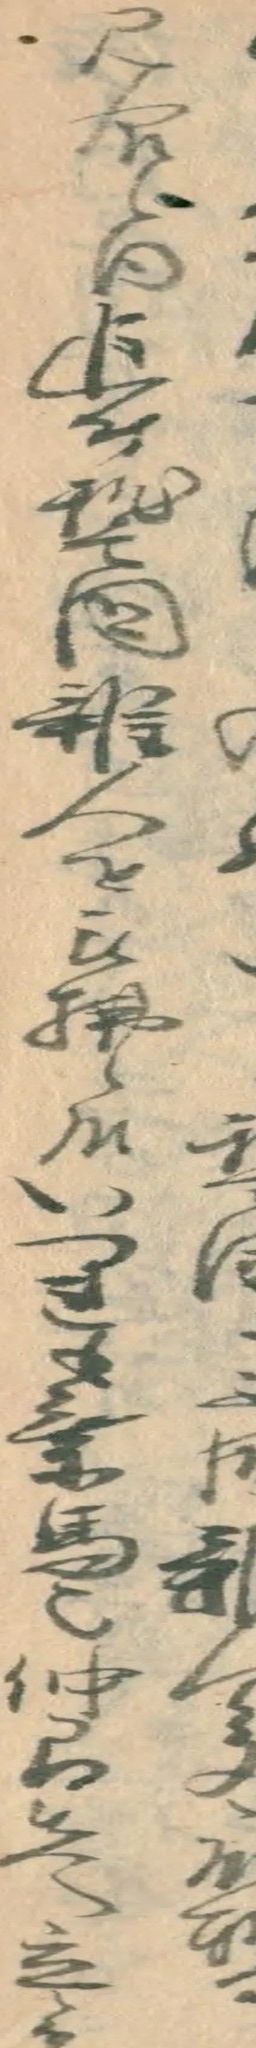見合候間追付諬固雑人を被払候故いつれも乗馬也仲間先へ立候而

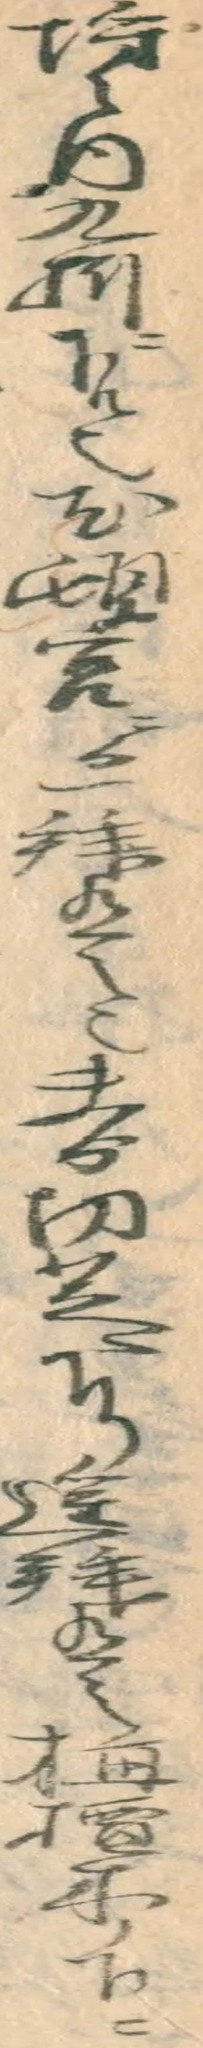埒之内九折ニ下ル也尤頓宮ニ而一拝有之也夫ゟ切芝へ下り遥拝有之栴檀木ノ下ニ
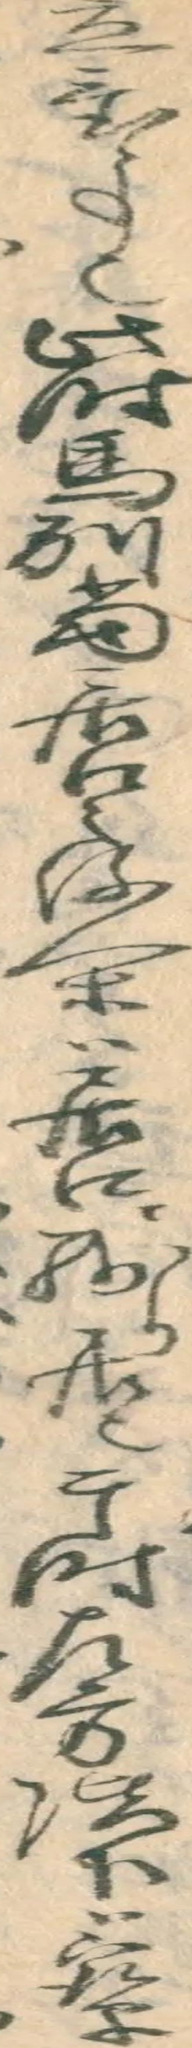立置候事也此時馬別当居口之役人等ハ居口ニ残り居也于時左方階下ハ最早
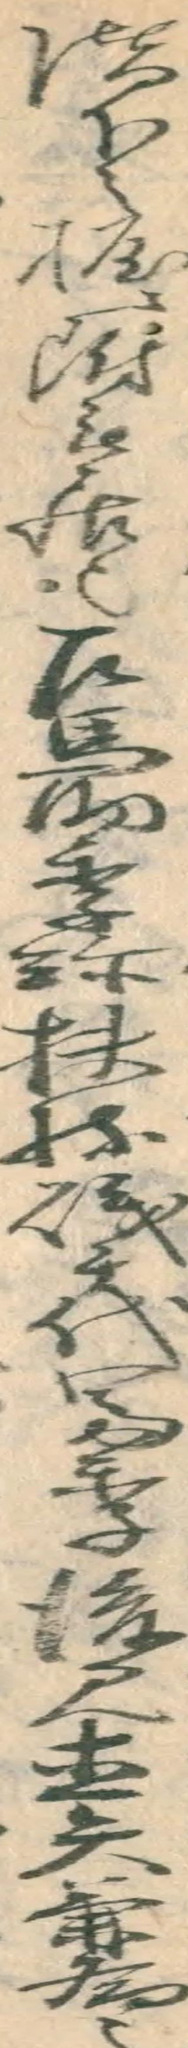階下之握ニ付被居也左馬助季珎扶持磯千代冨季後見直矢兼為也
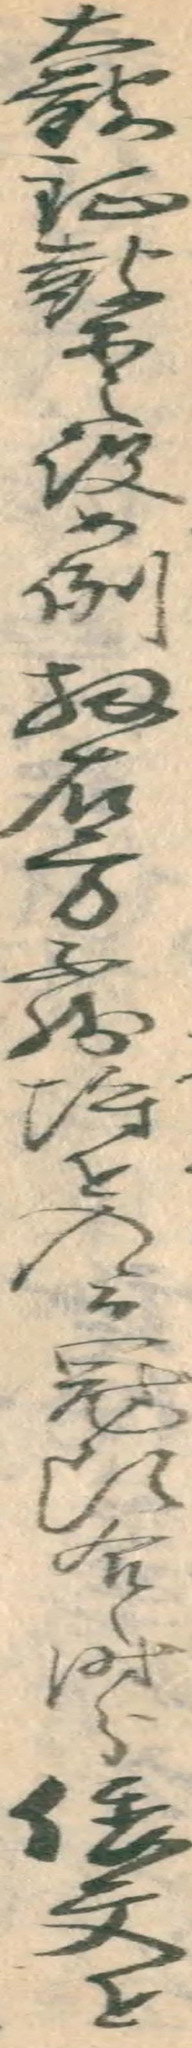大鼓鉦鼓等之役如例扨右方不残埒を入候而冠頭合之時分倭文を
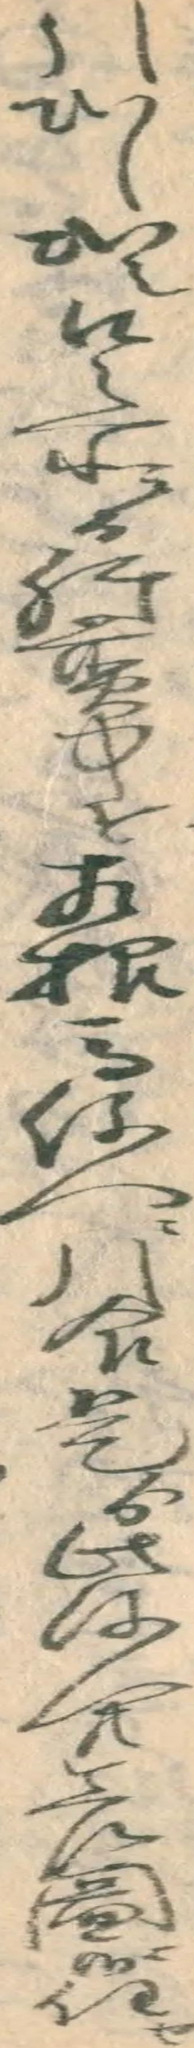引出し出シ口之所ニ而肝煎中を相招馬役人ニ引合是ゟ此役人共差図ニ御任セ
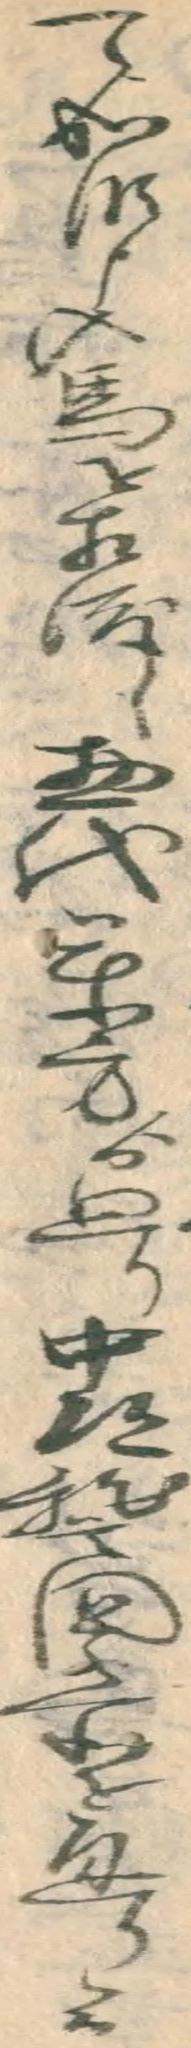可被成段申入馬を相渡し惣代ハ東方ゟ廻り中道諬固之所を通り候而
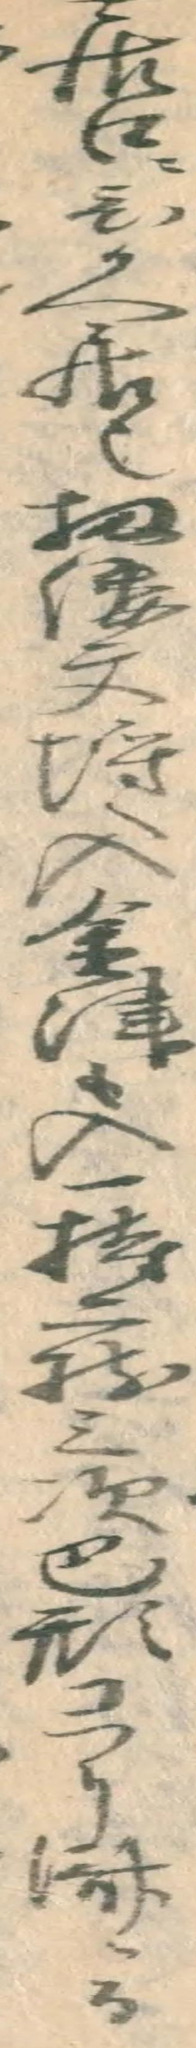居口ニひかへ居也扨倭文埒へ入金津も入一持二持三次巴形コフリ済候而
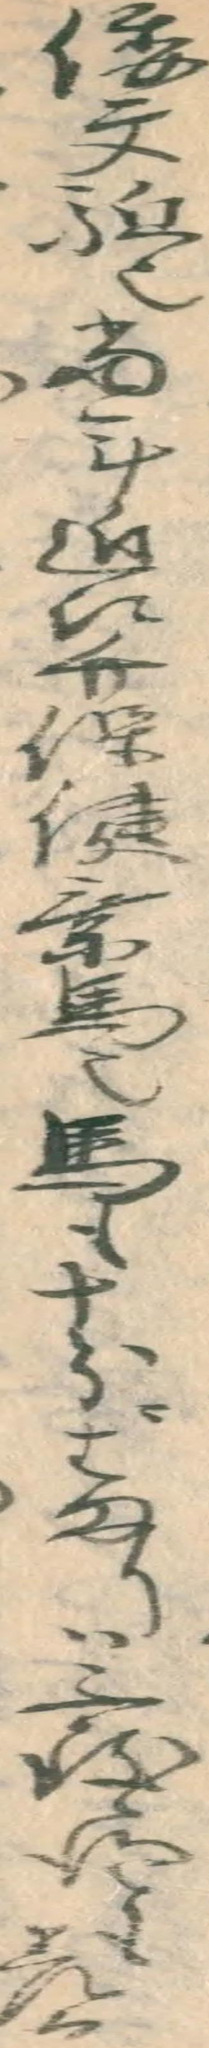倭文駈也当年近江介保健乗馬也馬も十分ニはまりハ不致候得とも差而
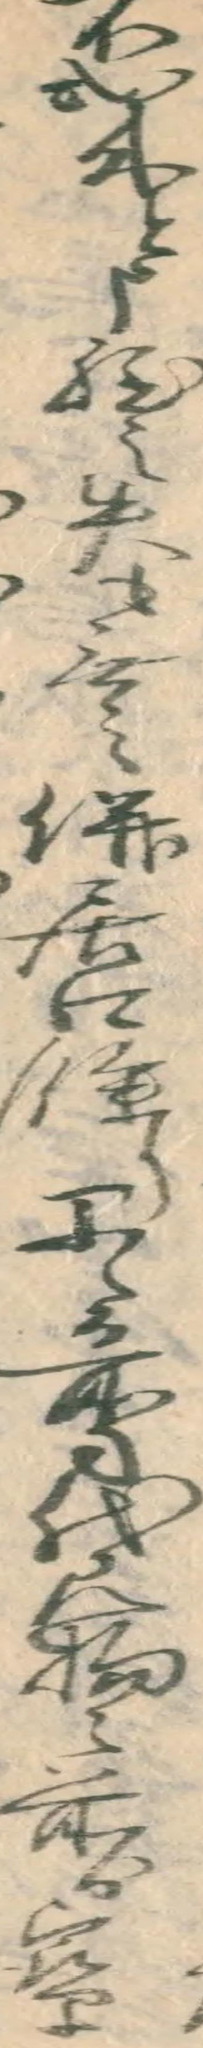不出来と申程之失も無之併居口余り早候而所司代見物之前ゟ最早
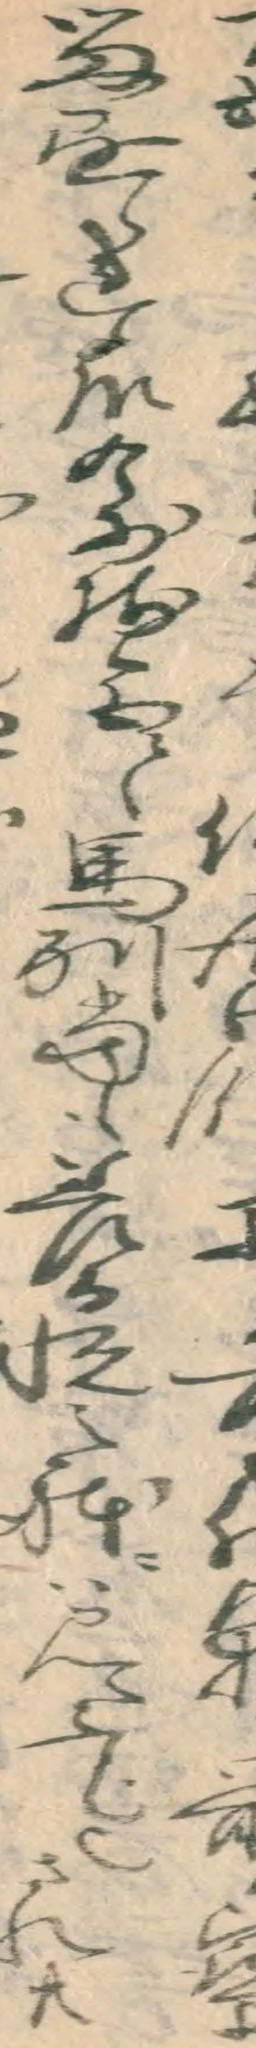留懸られ候故今少残念ニ候馬別当も差而悦之体ニハ見へ不申也され共
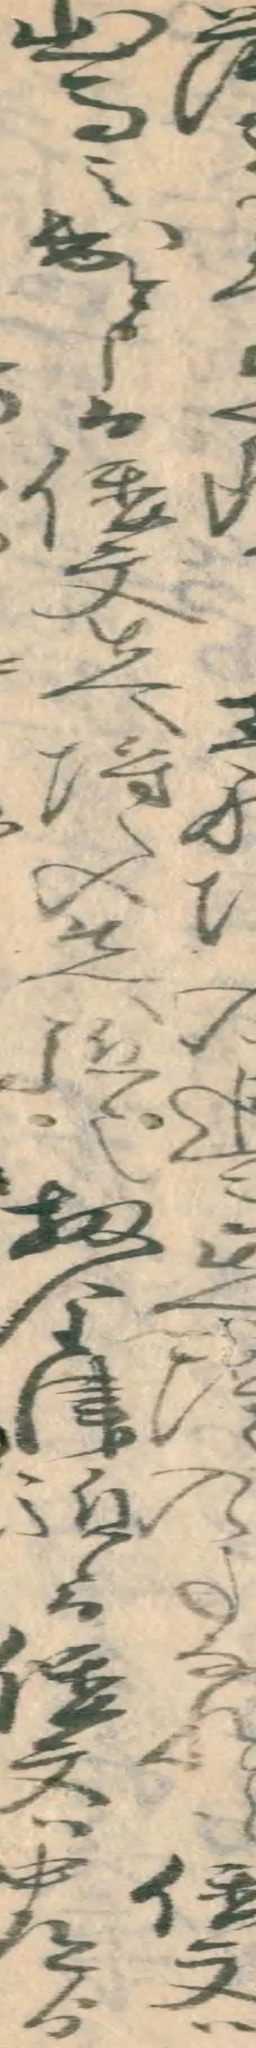出馬之出と申而倭文先へ埒へ入先へ駈也扨全津駈候而倭文ハ中道ゟ
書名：賀茂社記録. 第58冊
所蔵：国立国会図書館 National Diet Library, JAPAN
